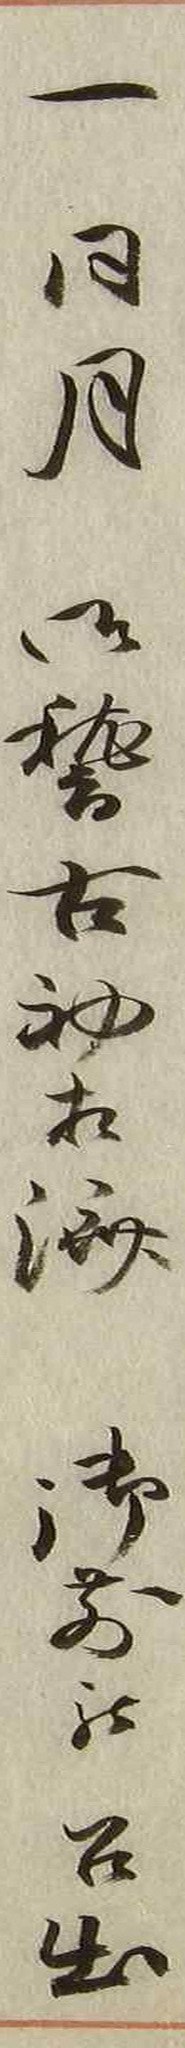一同月御稽古初相済御前被召出
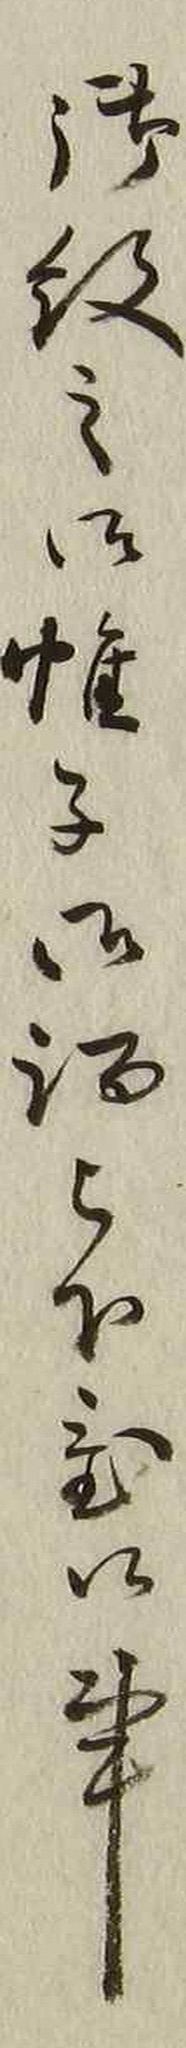御紋之御帷子御酒被下置候事
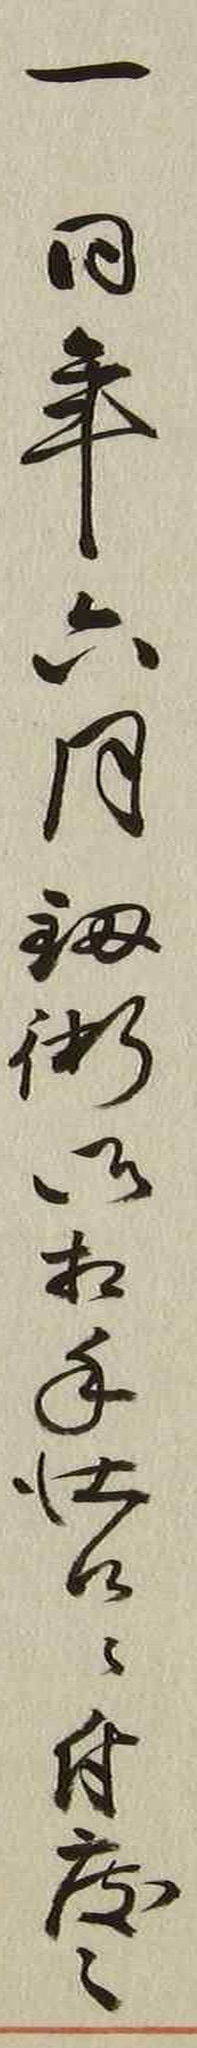一同年六月剣術御相手仕候ニ付度々
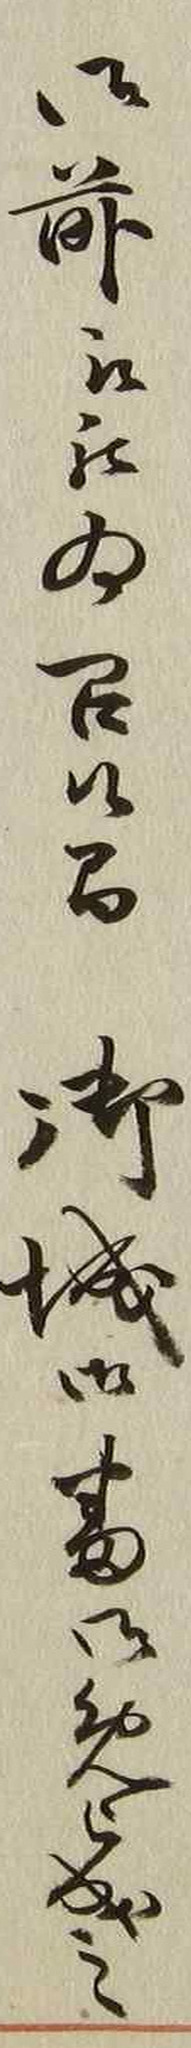御前江被為召候間御城御番御免被成之
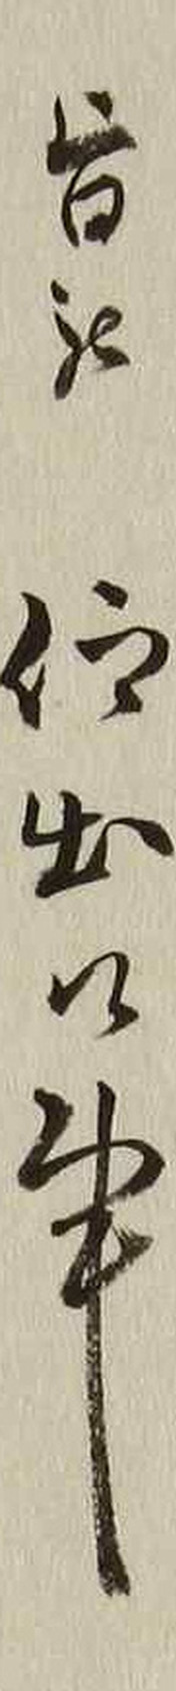旨被仰出候事
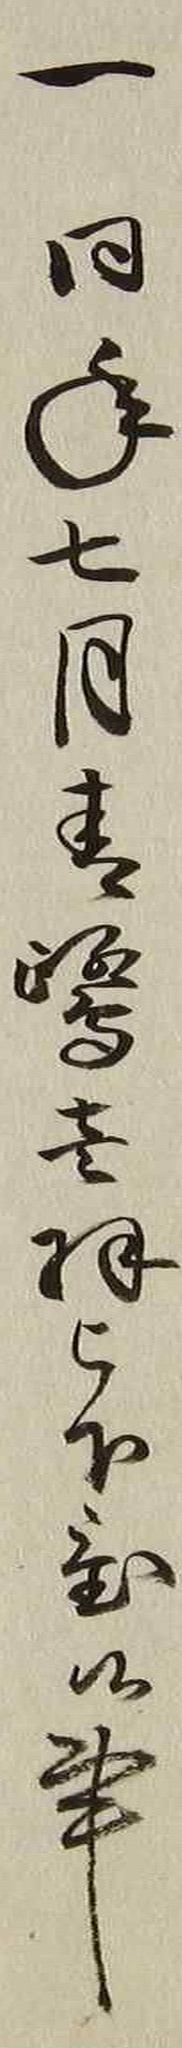一同年七月青鷺壱羽被下置候事
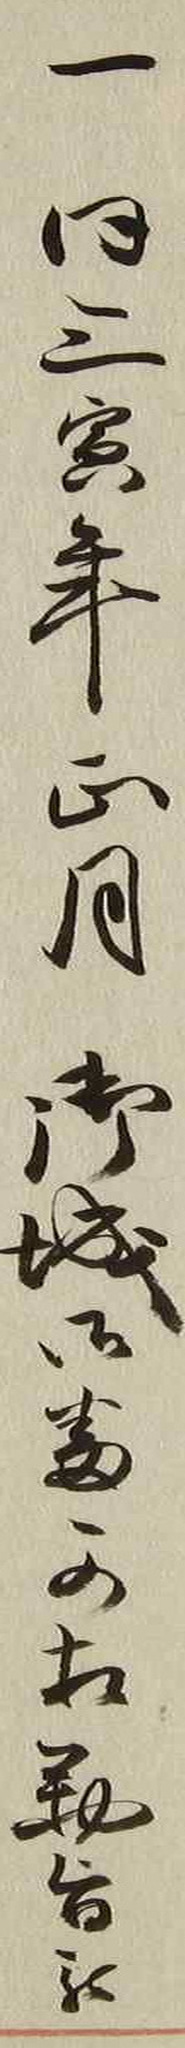一同三寅年正月御城御番可相勤旨被
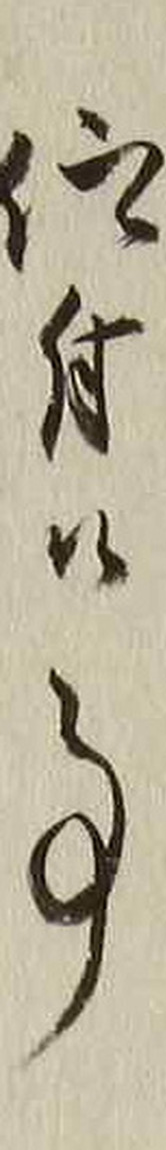仰付候事
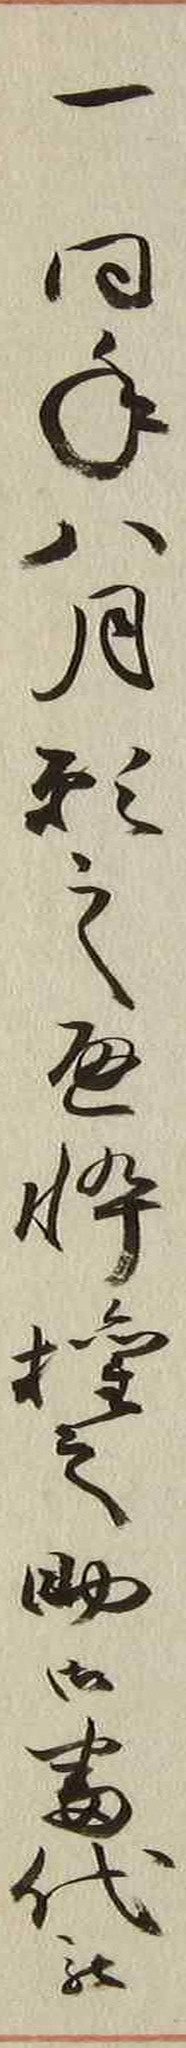一同年八月願之通忰権之助御番代被
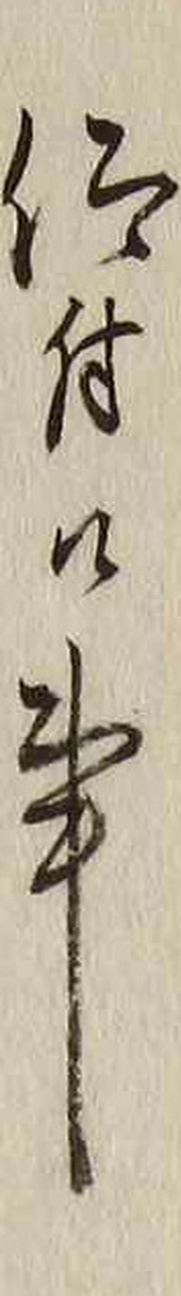仰付候事
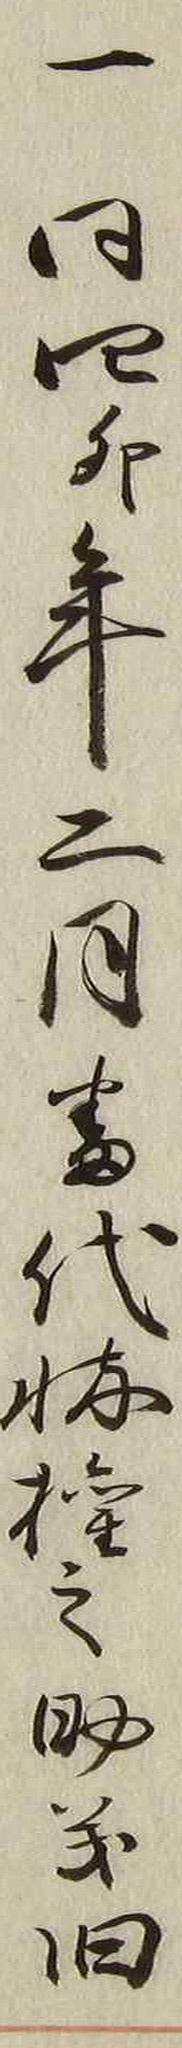一同四卯年二月番代忰権之助義旧
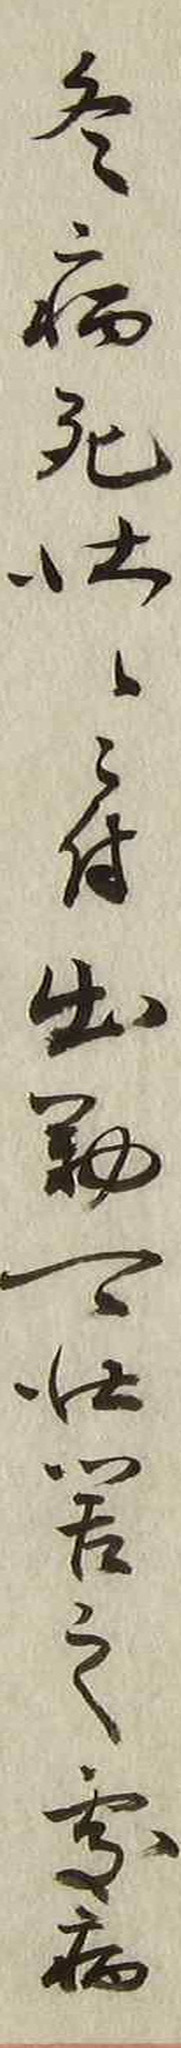冬病死仕候ニ付出勤可仕筈之処病
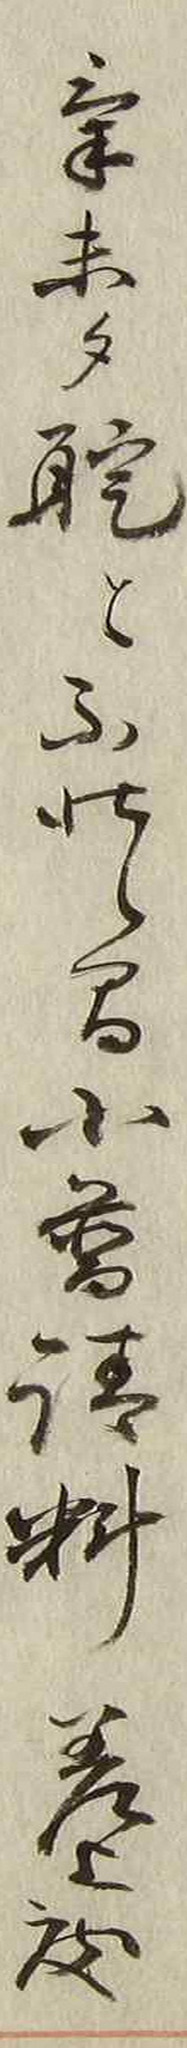気未タ聢と不仕候間小普請料差上度
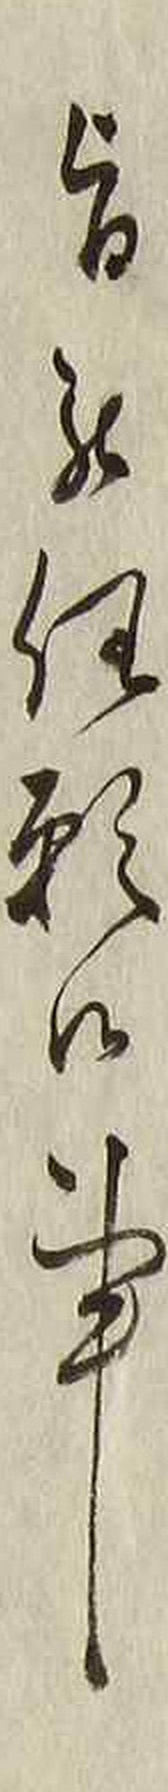旨被任願候事
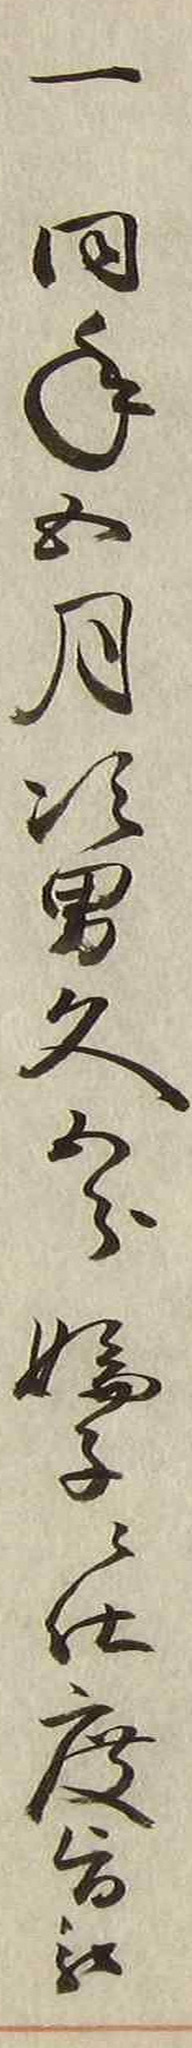一同年五月次男久五郎嫡子ニ仕度旨被
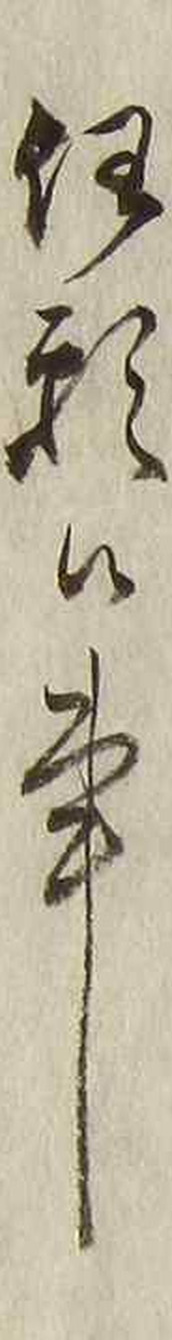任願候事
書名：諸士系譜　巻之15　い之部15
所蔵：会津若松市立会津図書館
